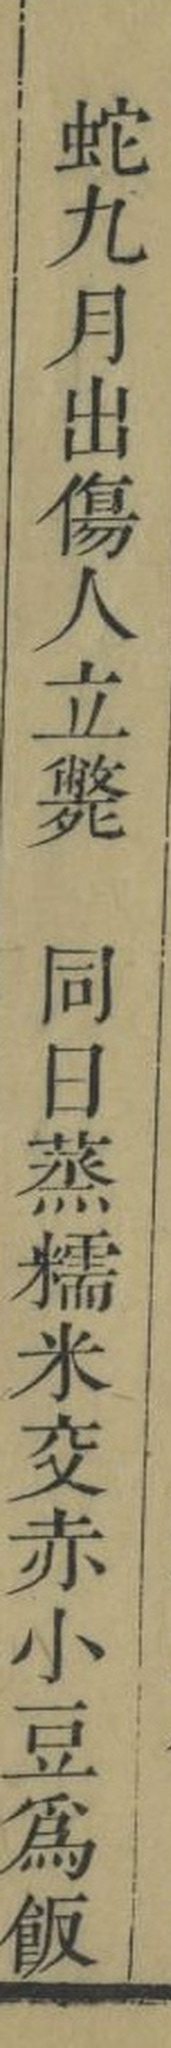蛇九月出傷人立斃同日蒸糯米交赤小豆為飯
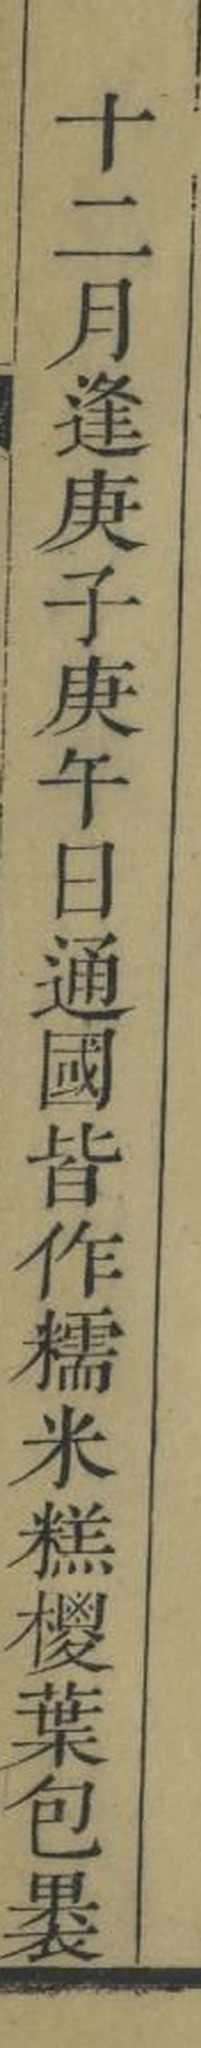十二月逢庚子庚午日通国皆作糯米糕棕葉包褁

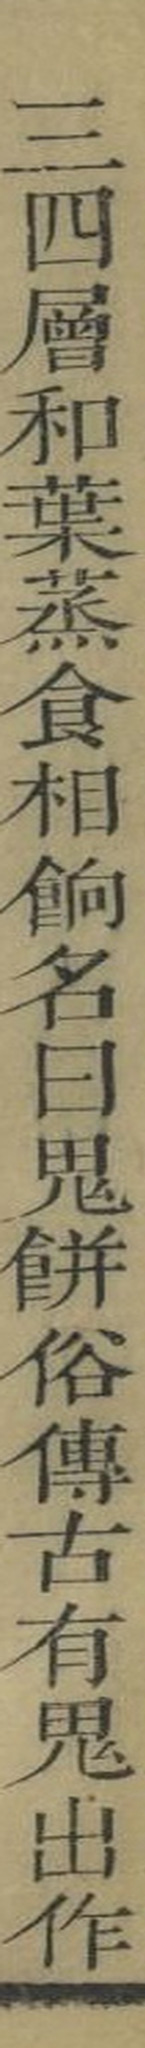三四層和葉蒸食相餉名曰鬼餅俗伝古有鬼出作
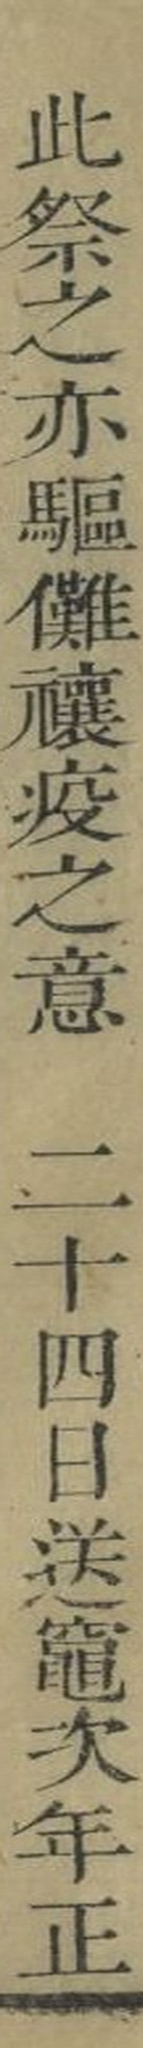此祭之亦駆儺禳疫之意二十四日送竈次年正
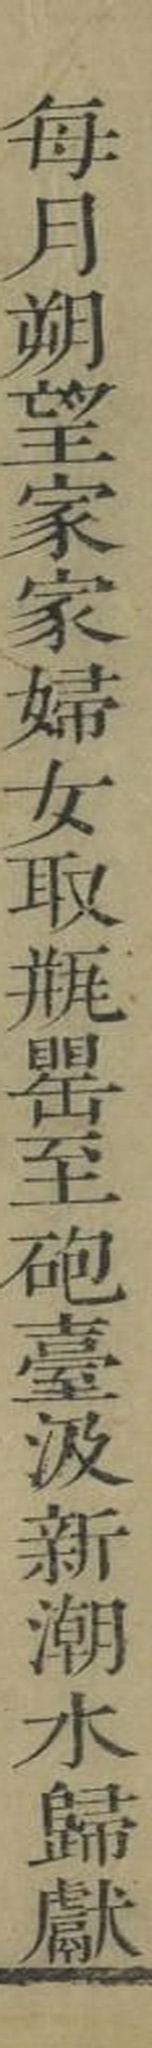毎月朔望家家婦女取瓶罌至砲台汲新潮水帰献
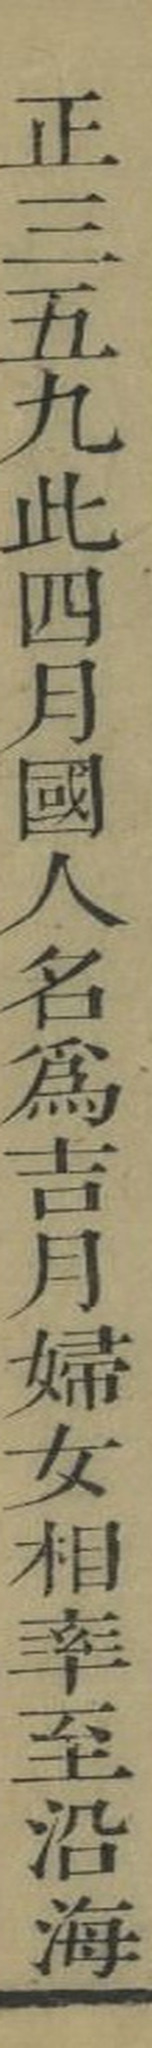正三五九此四月国人名為吉月婦女相率至沿海
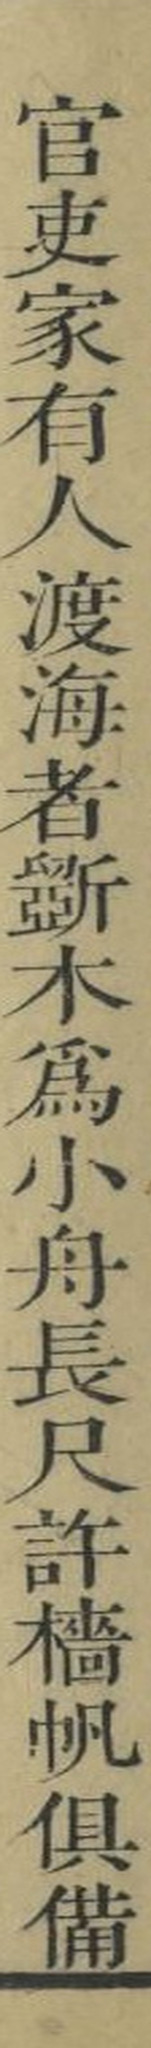官吏家有人渡海者斵木為小舟長尺許檣帆俱備
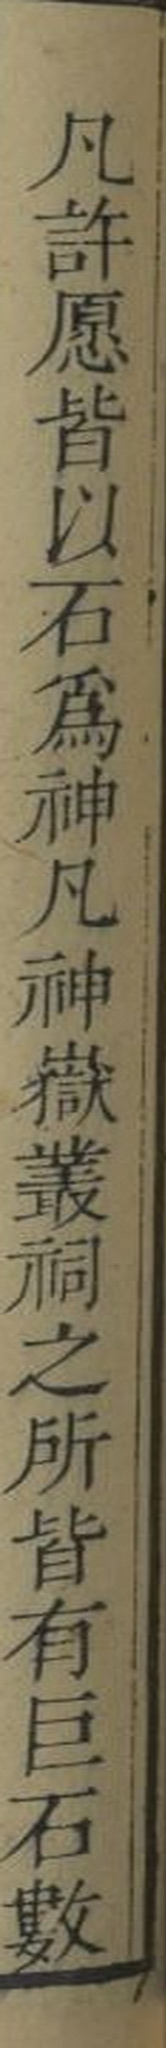凡許愿皆以石為神凡神岳叢祠之所皆有巨石数
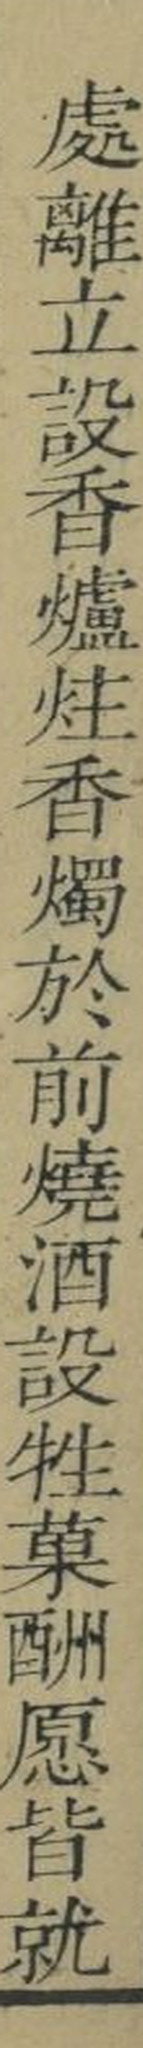処離立設香炉炷香燭於前焼酒設牲菓酬愿皆就
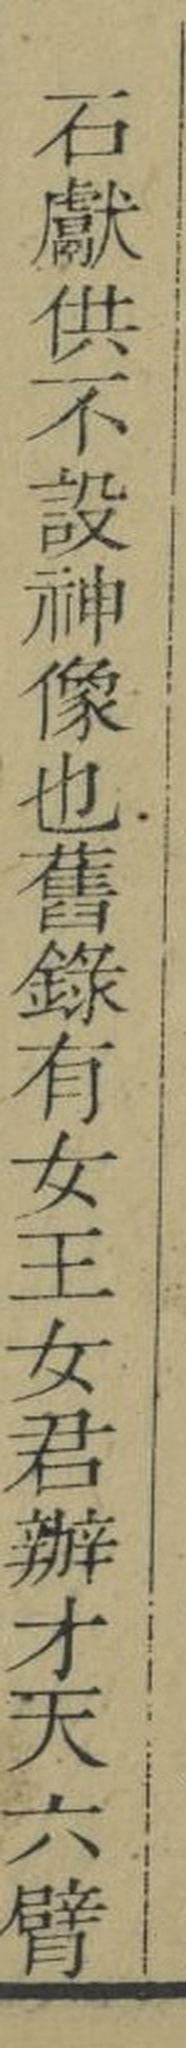石献供不設神像也旧録有女王女君弁才天六臂
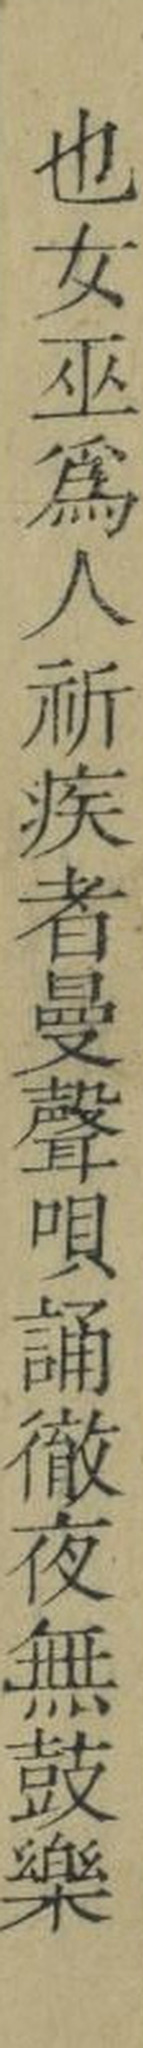也女巫為人祈疾者曼声唄誦徹夜無鼓楽
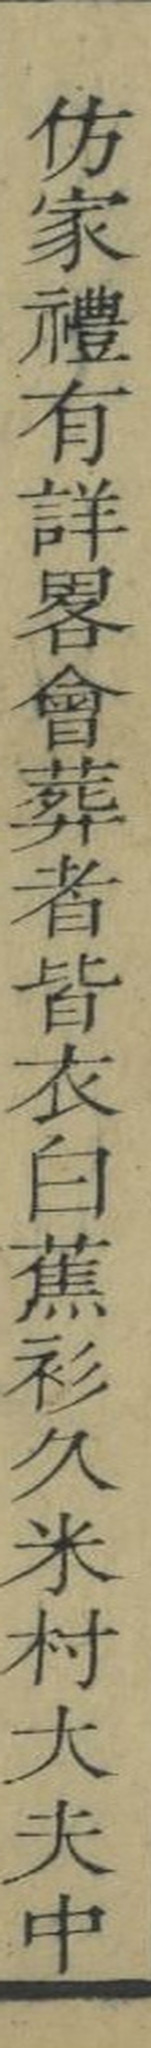仿家礼有詳略会葬者皆衣白蕉衫久米村大夫中
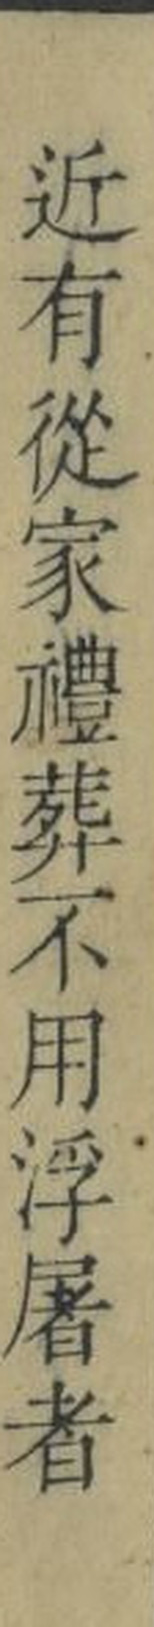近有従家礼葬不用浮屠者
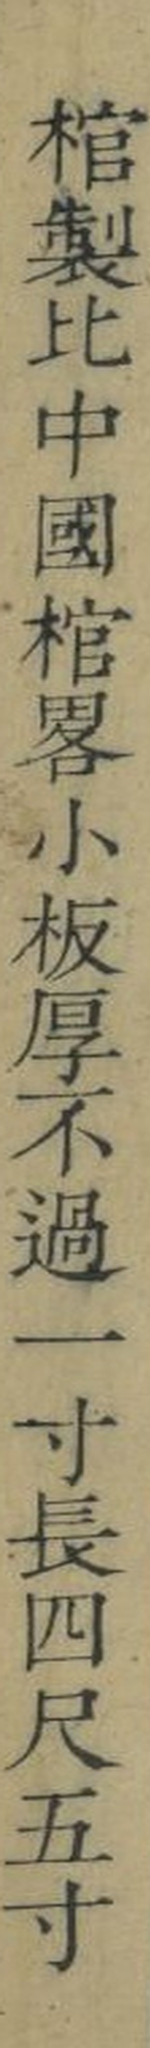棺製比中国棺略小板厚不過一寸長四尺五寸

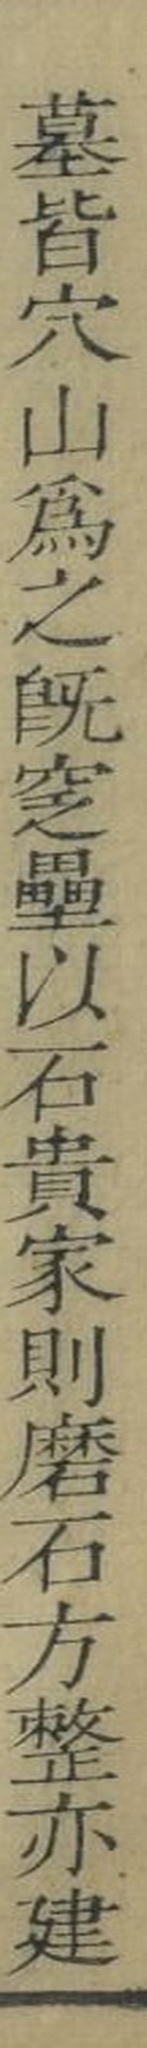墓皆穴山為之既窆壘以石貴家則磨石方整亦建
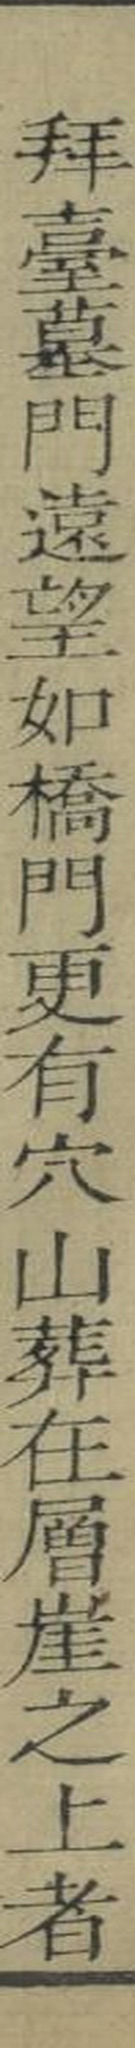拝台墓門遠望如橋門更有穴山葬在層崖之上者
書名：中山伝信録 巻六
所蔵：University of the Ryukyus Library
